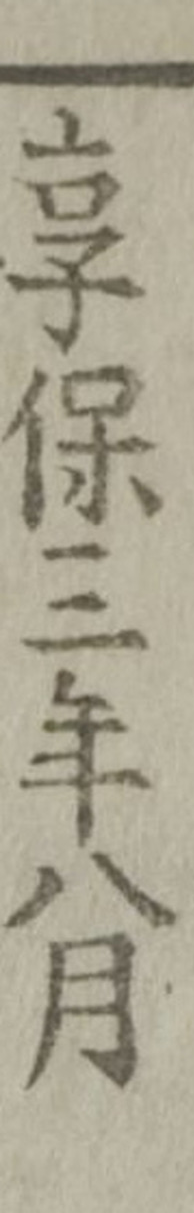享保三年八月同
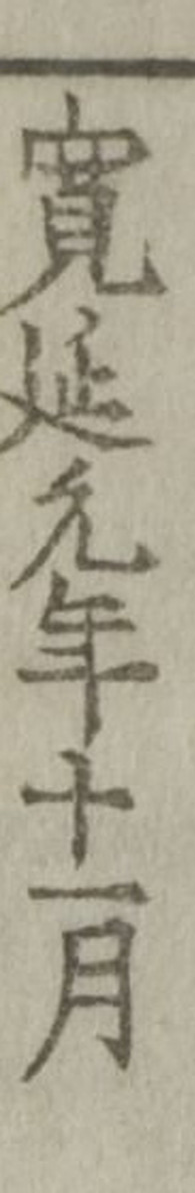寛延元年十一月同
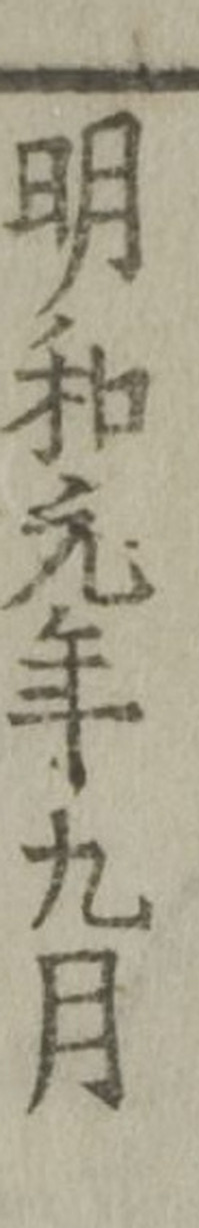明和元年九月同
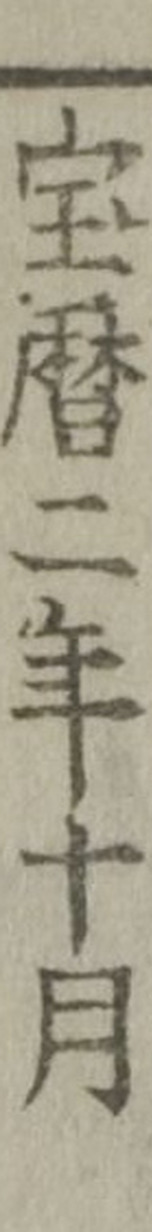宝暦二年十月同
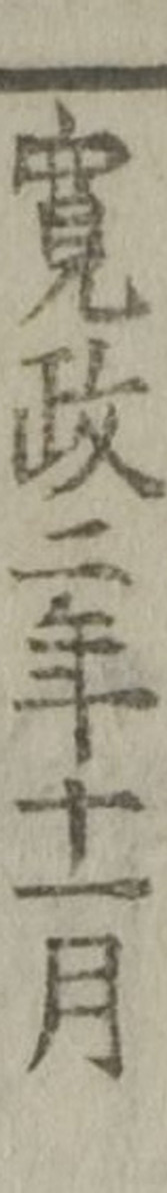寛政二年十一月同
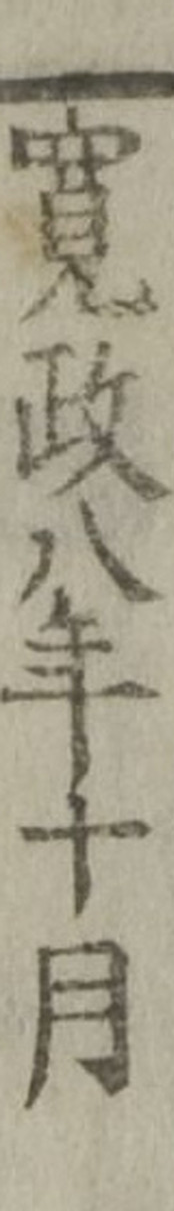寛政八年十月同
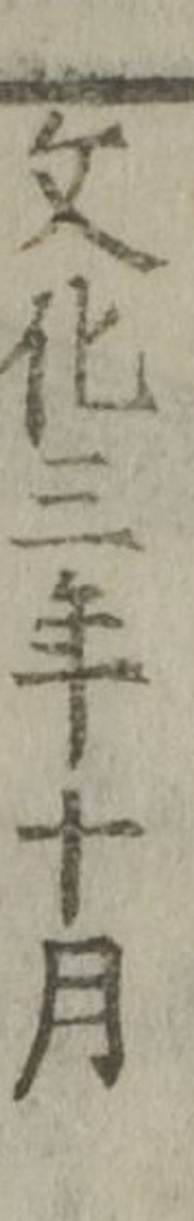文化三年十月同
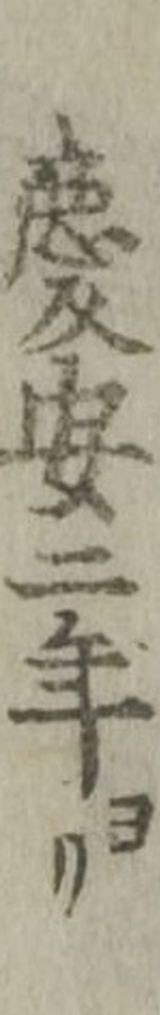慶安二年ヨリ
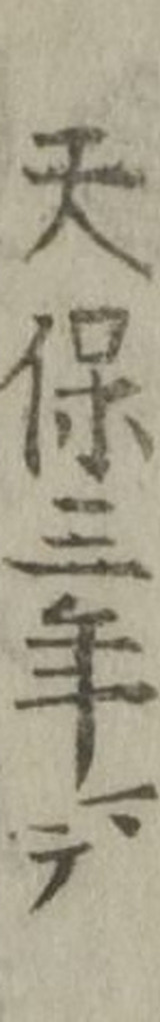天保三年マテ
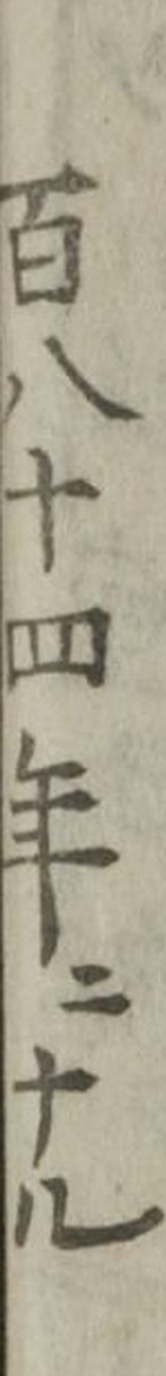百八十四年ニナル
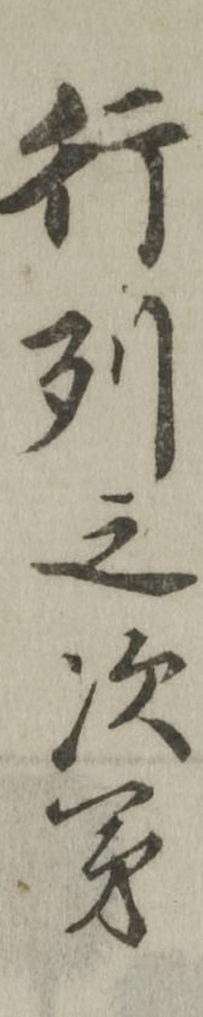行列之次第
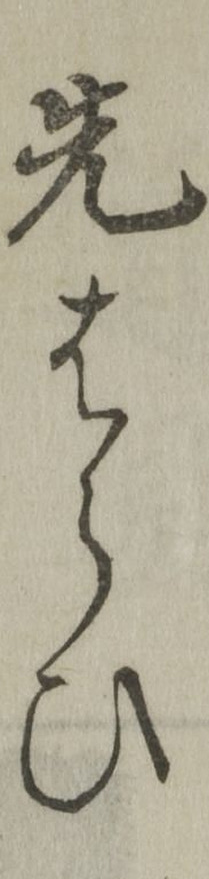先はらひ

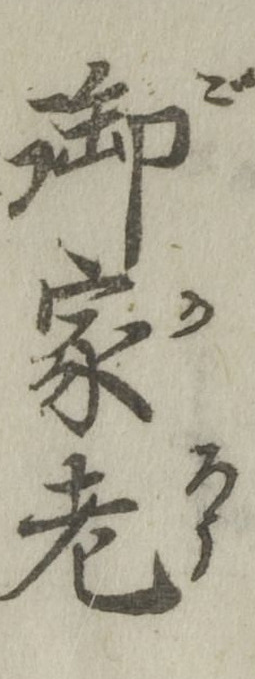御家老
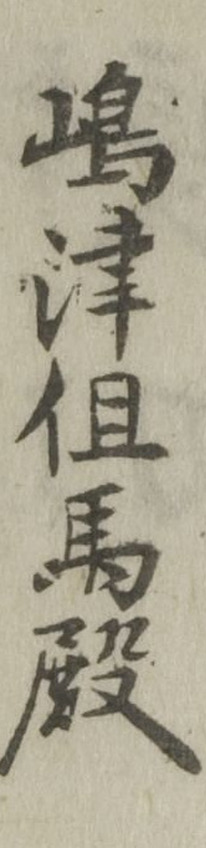島津但馬殿
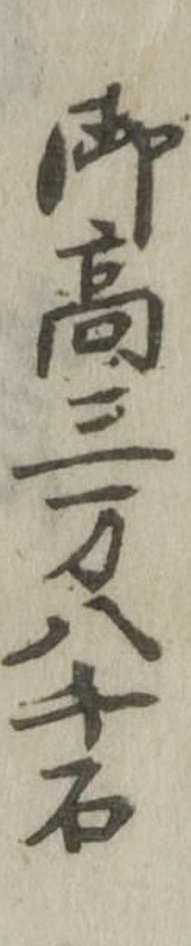御高三万八千石

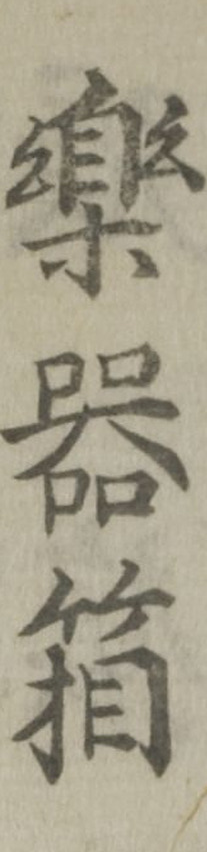樂器箱
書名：琉球人行列記 天保3年
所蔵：University of the Ryukyus Library
